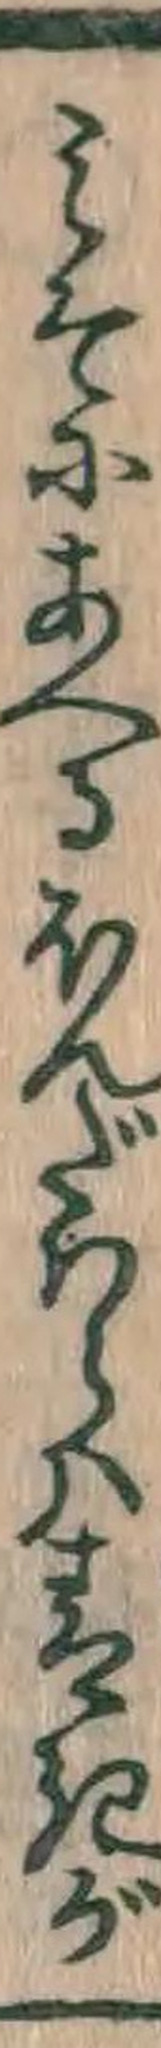みそにあへるほんだはらは青きが
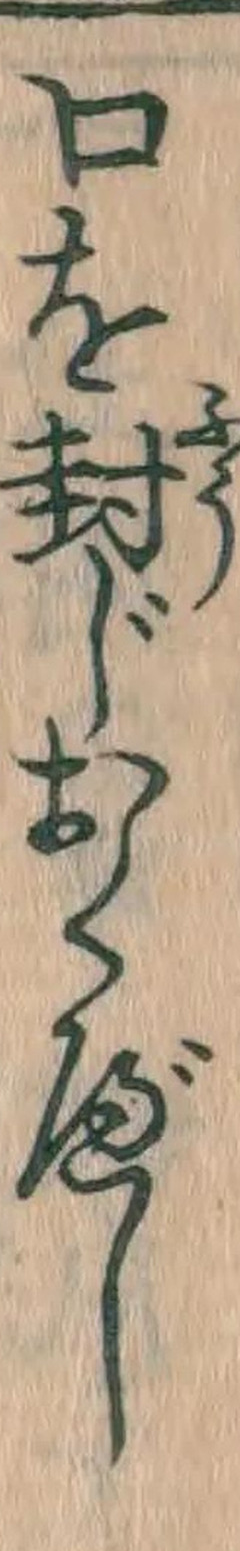口を封じおくべし
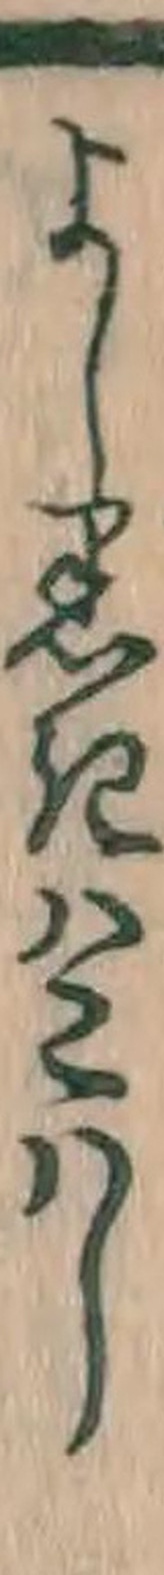よし黒きはこはし
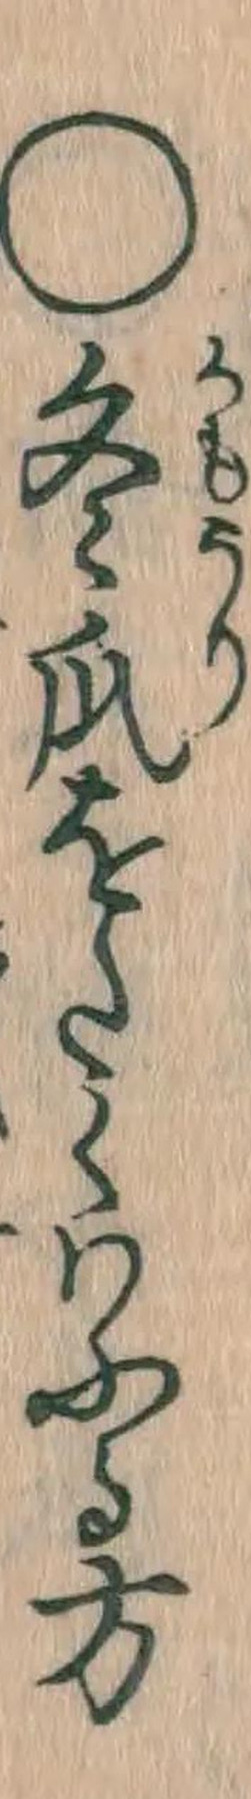○冬瓜をたくはふる方
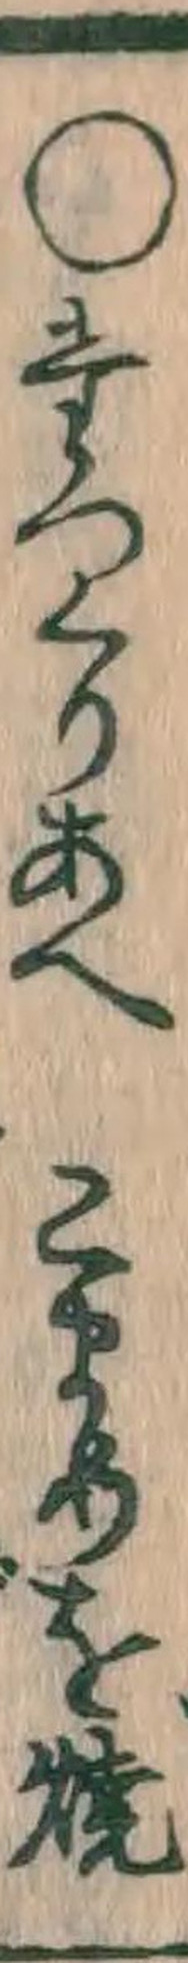○たつくりあへこまめを焼
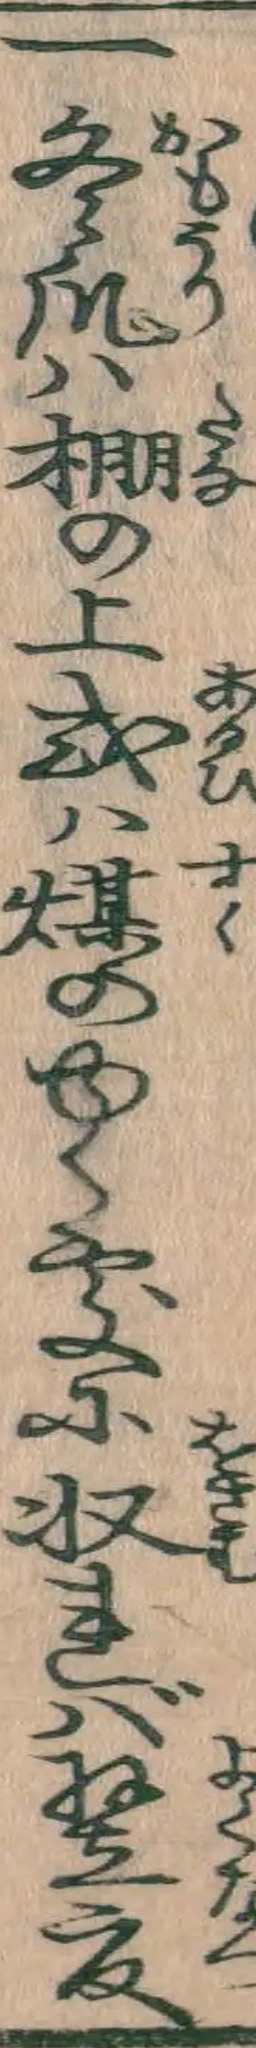一冬瓜は棚の上或は煤のゆく処に収れば翌夏
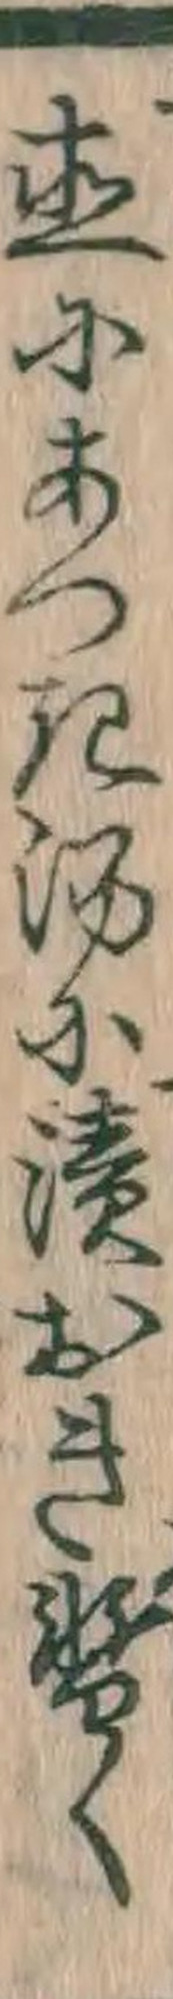直にあつき湯に漬おき暫く
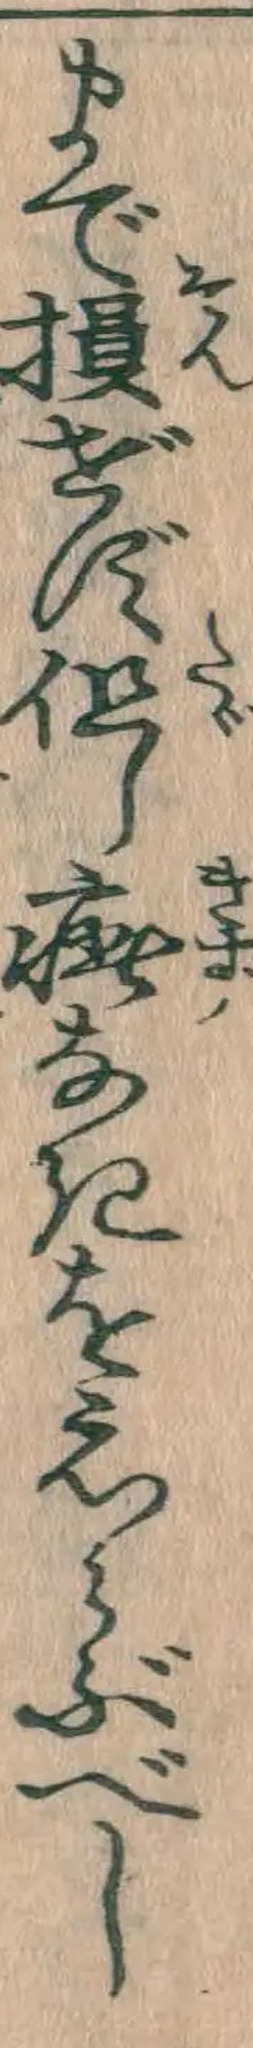まで損ぜず但し疵なきをえらぶべし
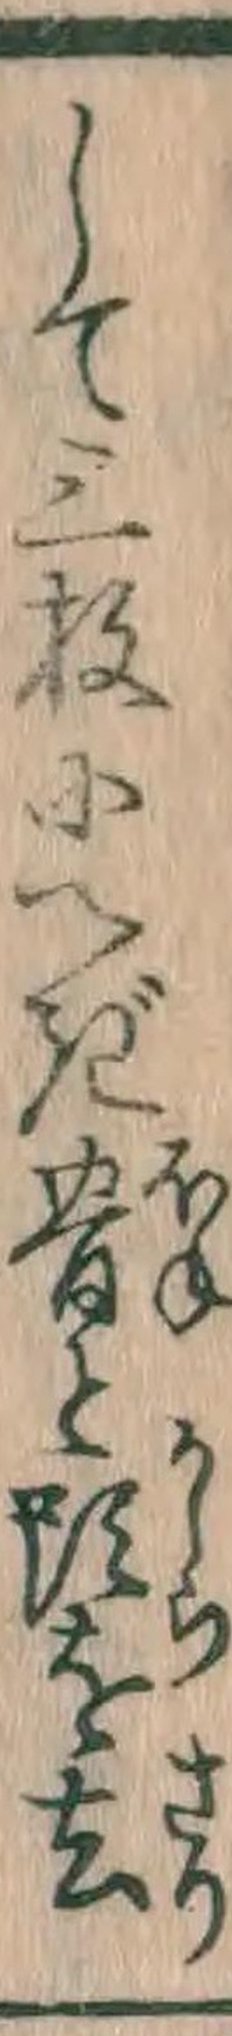して三枚にへぎ骨と頭を去
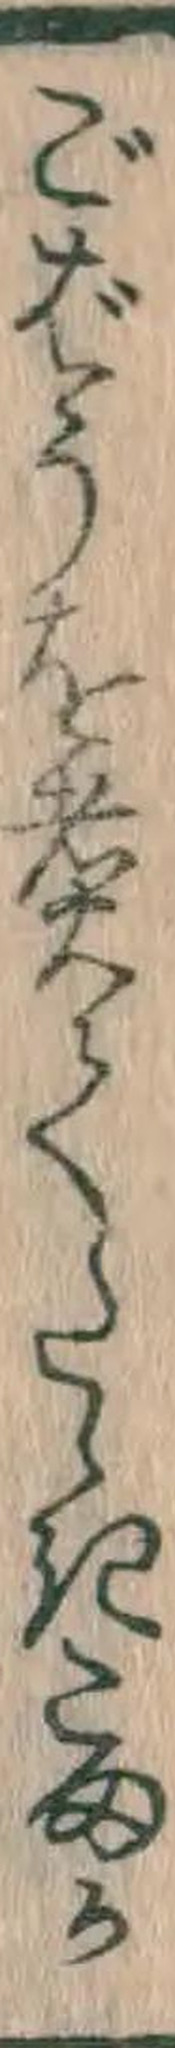ごばうを煮てたゝきこまか
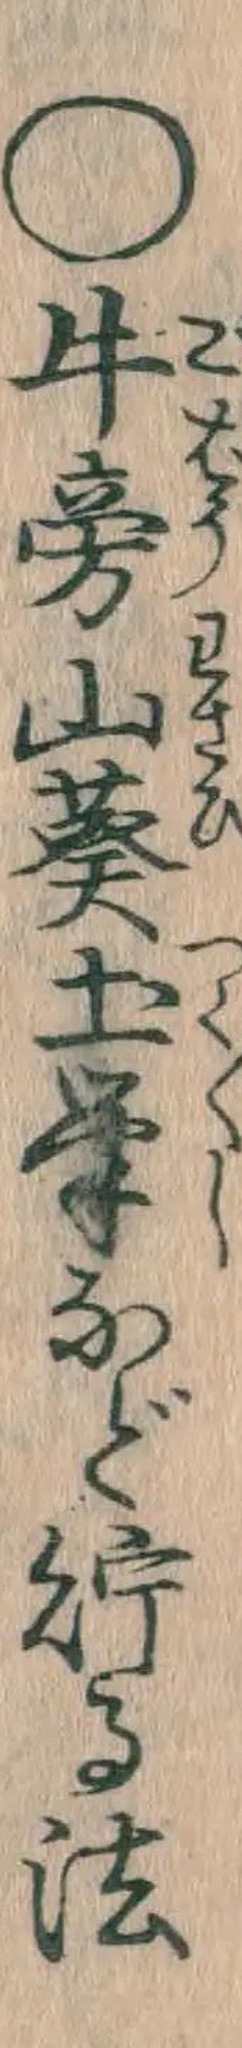○牛旁山葵土筆など貯る法
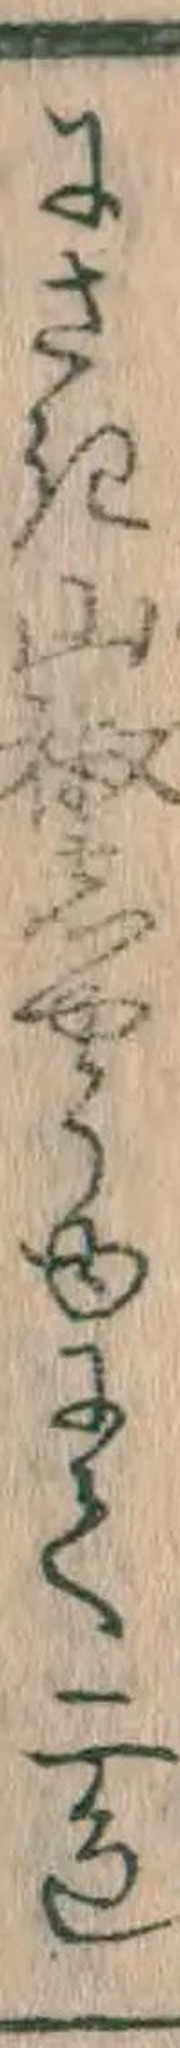にさき山椒しやうゆにて二色
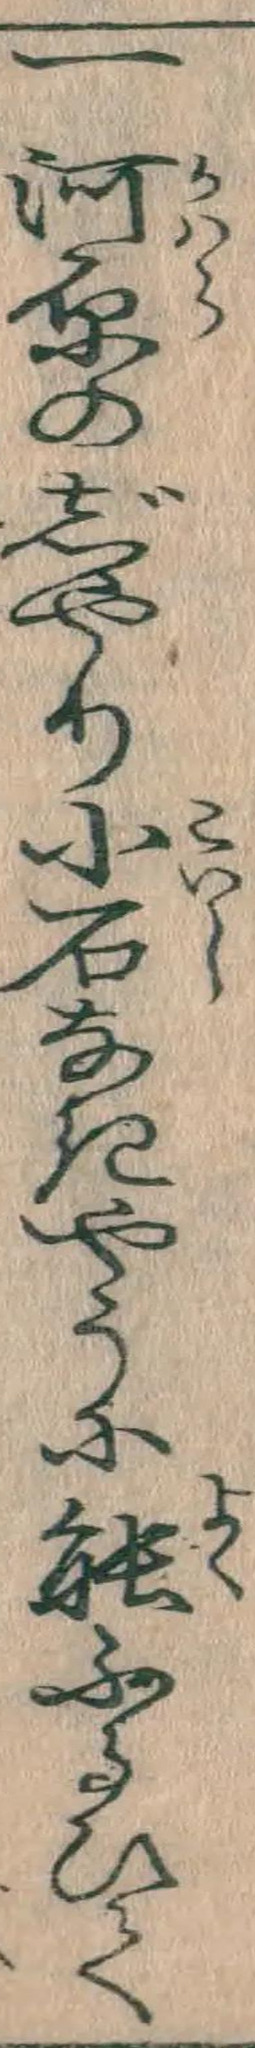一河原のじやり小石なきやうに能をふるひて
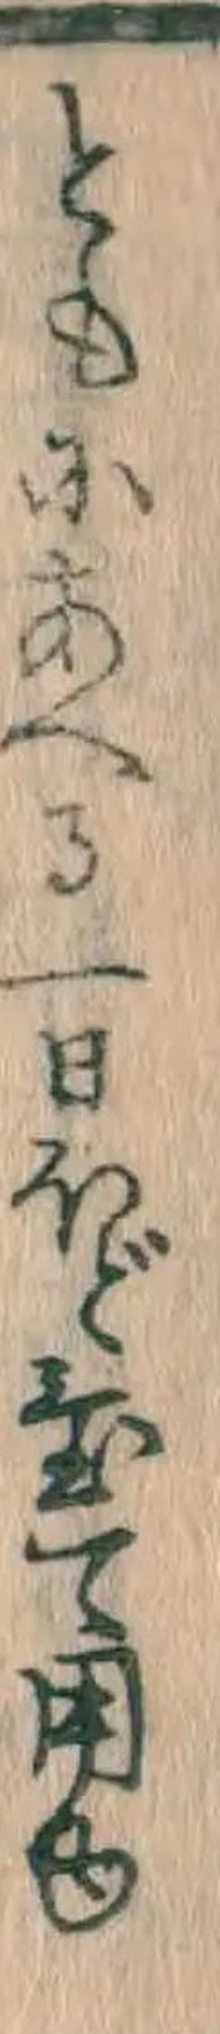ともにあへる一日ほど置て用ゆ
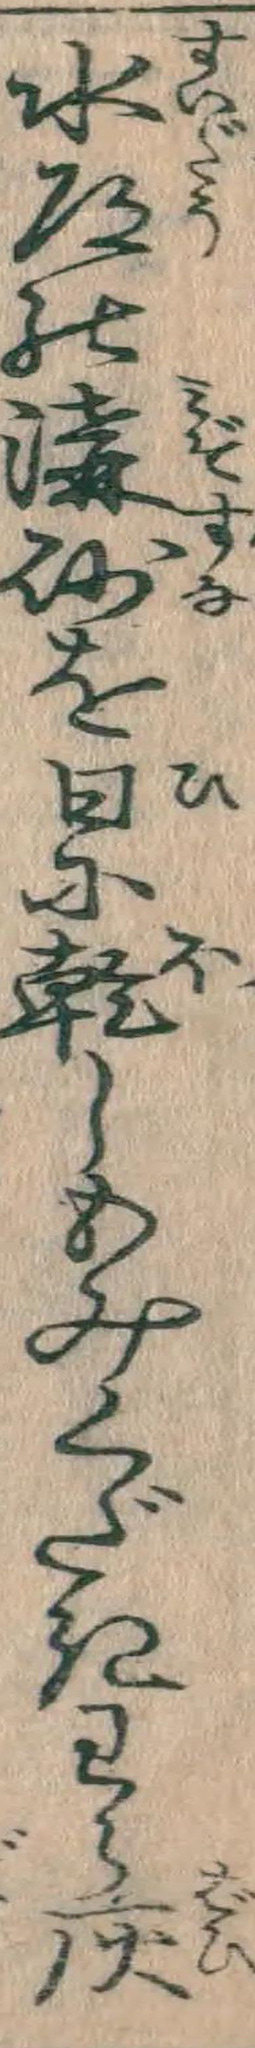水道の溝砂を日に乾しもみくだきわら灰
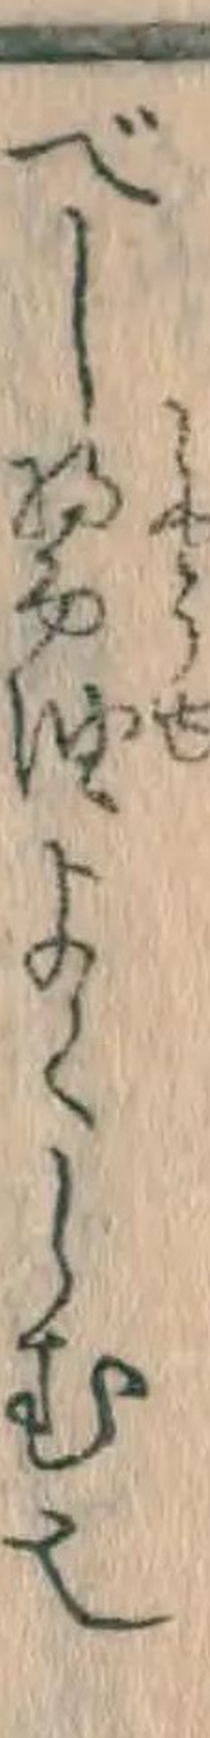べし醬油よくしむ也
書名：広益秘事大全 3巻. [5]
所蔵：国立国会図書館 National Diet Library, JAPAN
